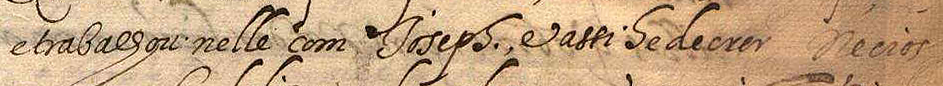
e trabalhou nelle com Ioseph e assi he de crer necios
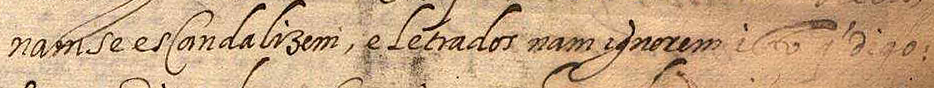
nam se escandalizem, e letrados nam ignorem isto q̄ digo:
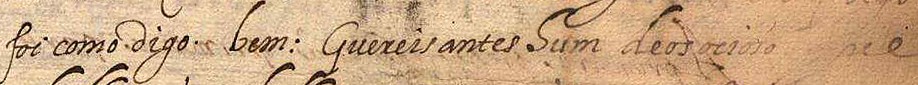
foi como digo bem: Quereis antes hum deos ocioso que
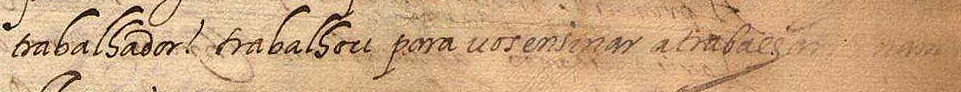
trabalhador? trabalhou para uos ensinar a trabalhar e nam
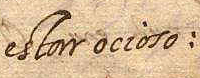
estar ocioso:
